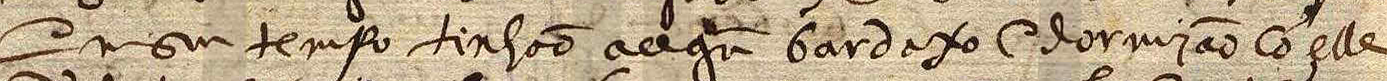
e no seu tempo tinhaõ allgū bardaxo e dormjão cō elle
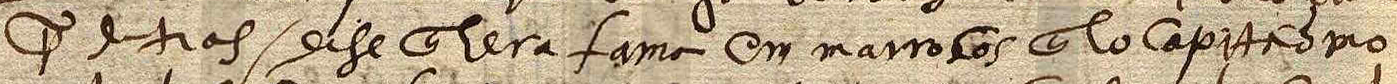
p̄o detras / dise q̅ hera fama em marrocos q̅ ho Capitaõ mo
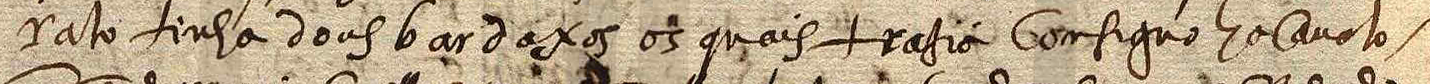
rato tinha dous bardaxos os quais trazia Comsiguo ha caualo /
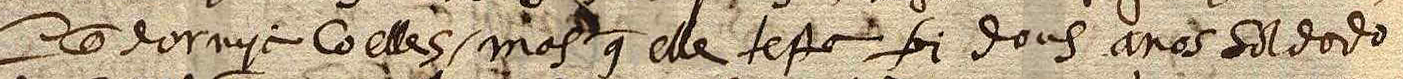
e q̄ dormja co elles / mas q̄ elle testa foi dous anos soldado
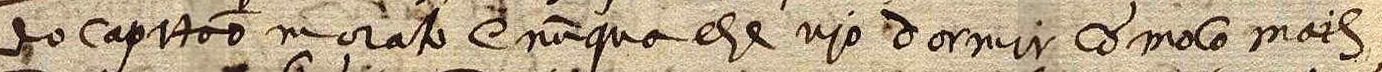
do capitão morato e nūqua lhe ujo dormir cō moço mais
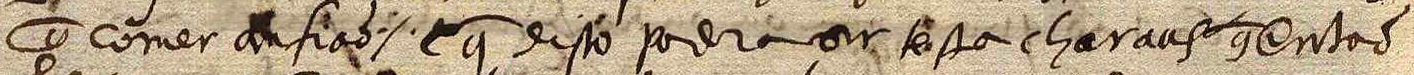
q̄ comer anfiaõ ./. e q̄ disto podera ser testa charaus q̄ entaõ
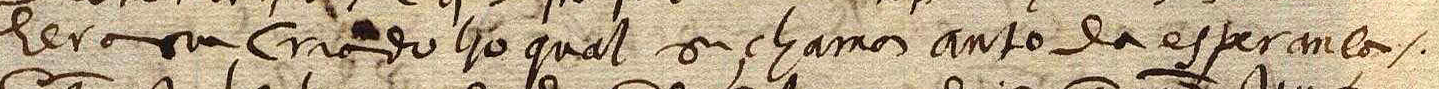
hera seu Criado ho qual se chama anto da esperança /.
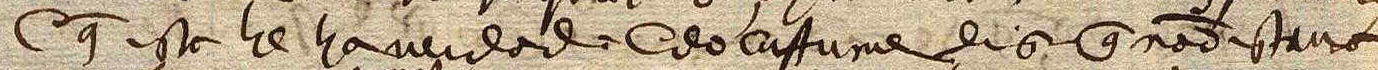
e q̄ esta he ha uerdade e do custume dise q̄ não estaua
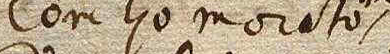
com ho morato /
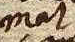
mal
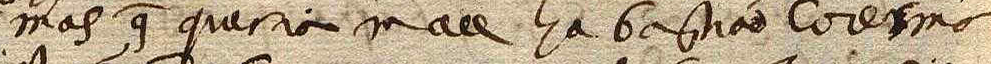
mas q̄ queria mall ha bastiaõ coresma
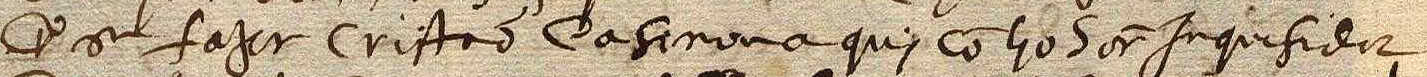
p̄o se fazer cristaõ e asinou aquj co̅ ho sor̄ Jnquisidor
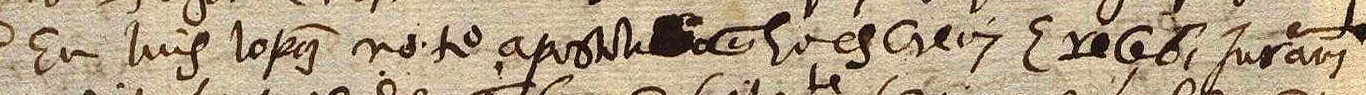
e Eu luis lopēz notro apostoli_o q̄ ho escrevj E recebi Juramto
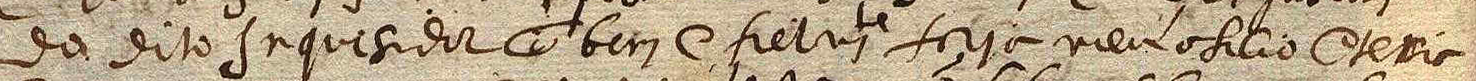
do dito Jnquisidor q̄ bem e fielmte fazja meu oficio e teria
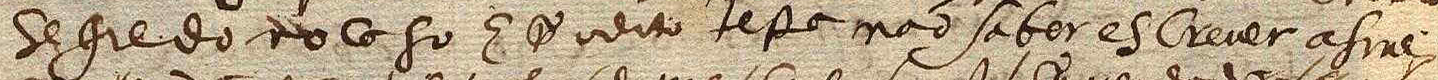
segredo no caso E p̄o o dito testa naõ saber esCreuer asinej
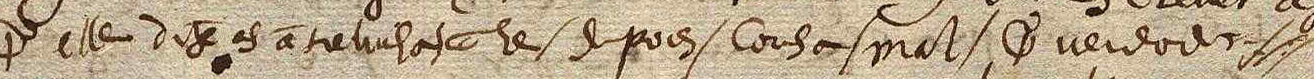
p̄o elle dise as ātrelinhas q̄ he / depois / cousa / mal / p̄o uerdade ///
